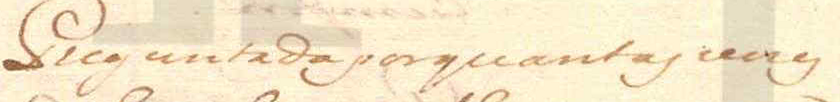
Preguntada por quantas vezes
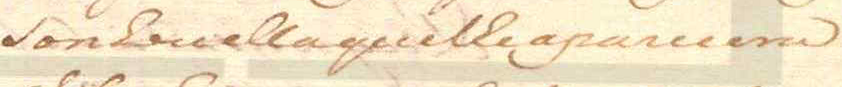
sonhou ella que lhe aparecera
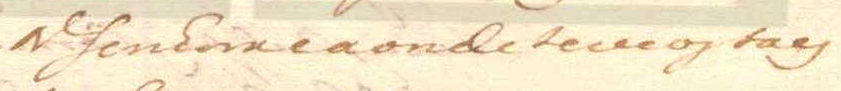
N senhora e aonde teve os taes
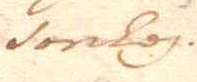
sonhos.
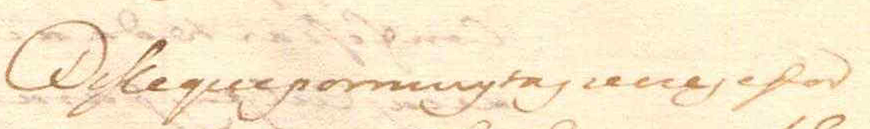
Disse que por muytas vezes e por
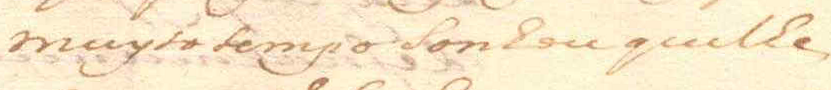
muyto tempo sonhou que lhe
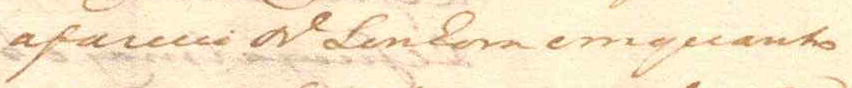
aparcece N Senhora emquanto
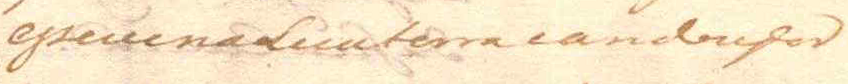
esteve na sua terra e andou por
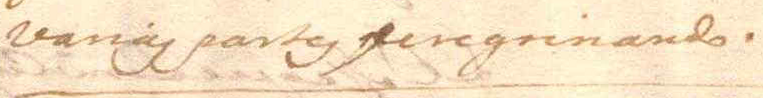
varias partes peregrinando.
